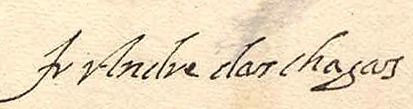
fr Andre das chagas
